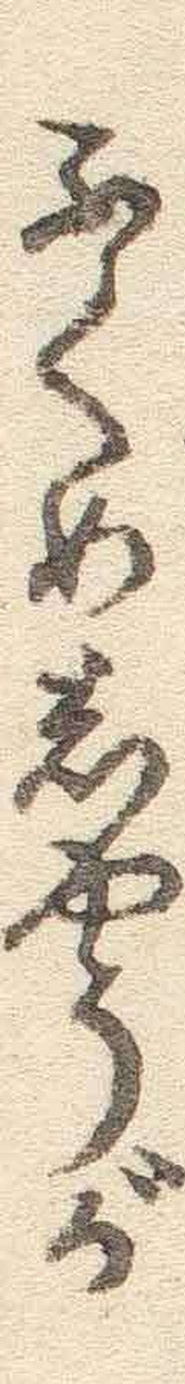ふくめしやうが
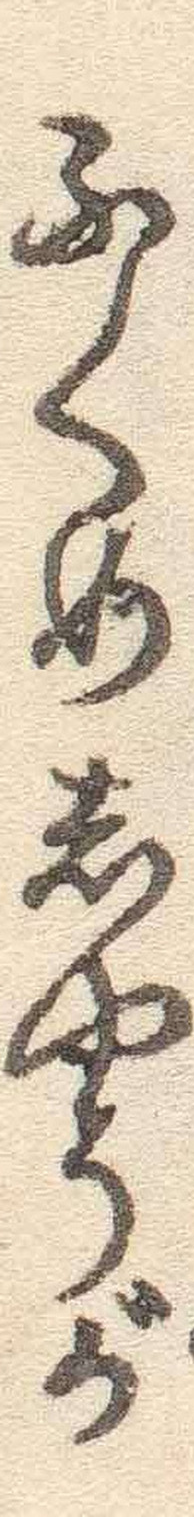ふくめしやうが
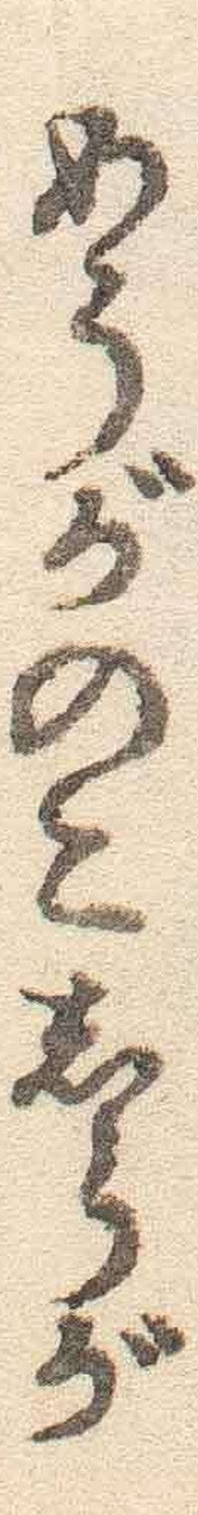めうがのこしらが
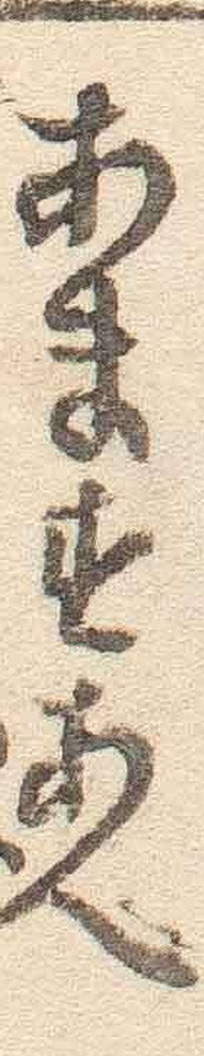あますあへ
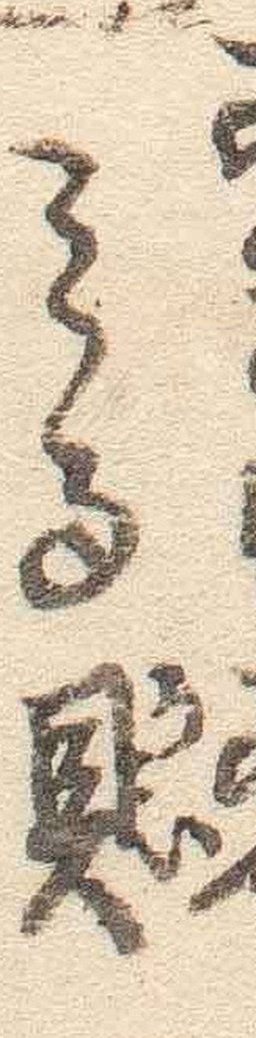みる貝
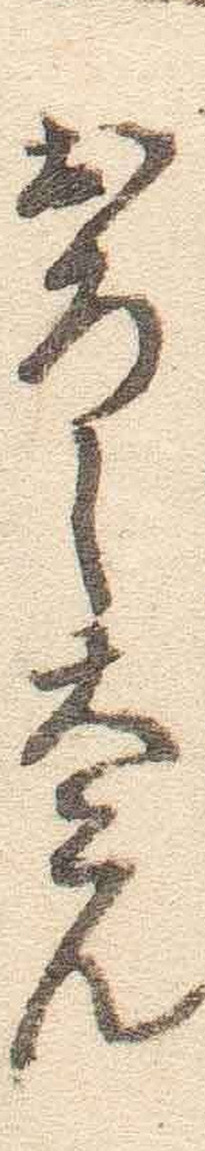おろし大こん
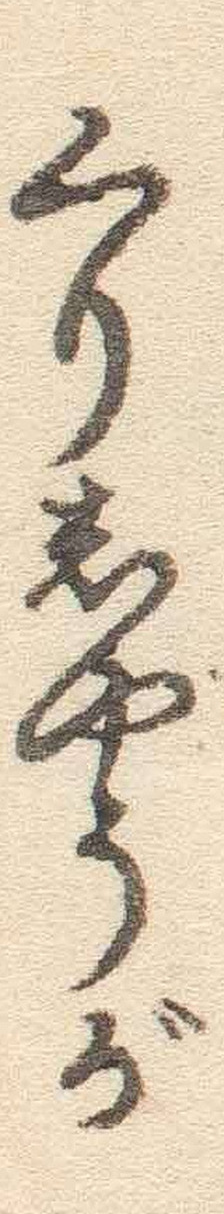ふくめしやうが
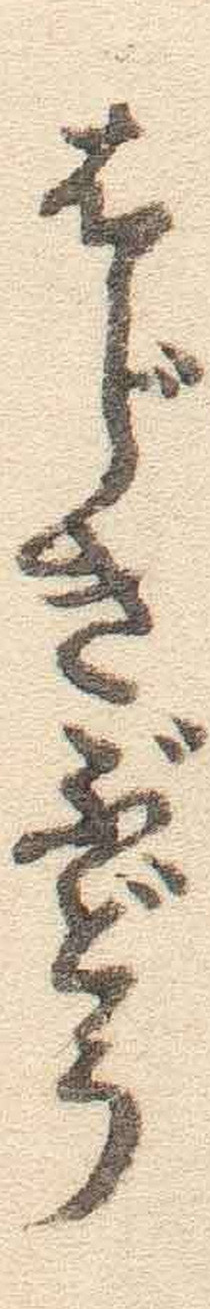はじきぶどう
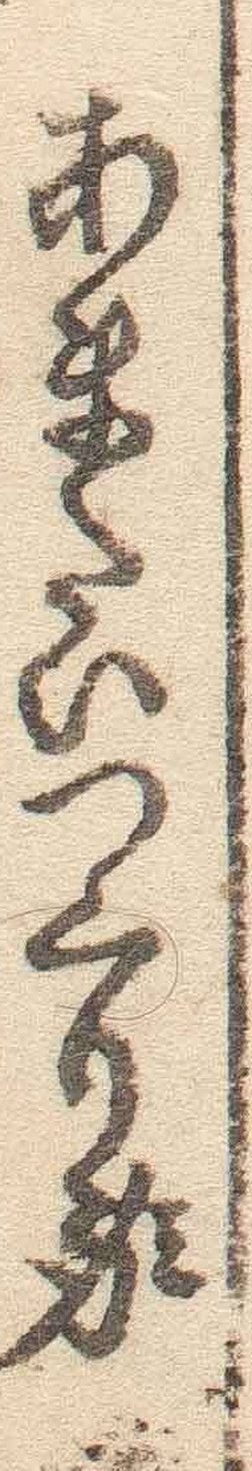あまたいつくり身
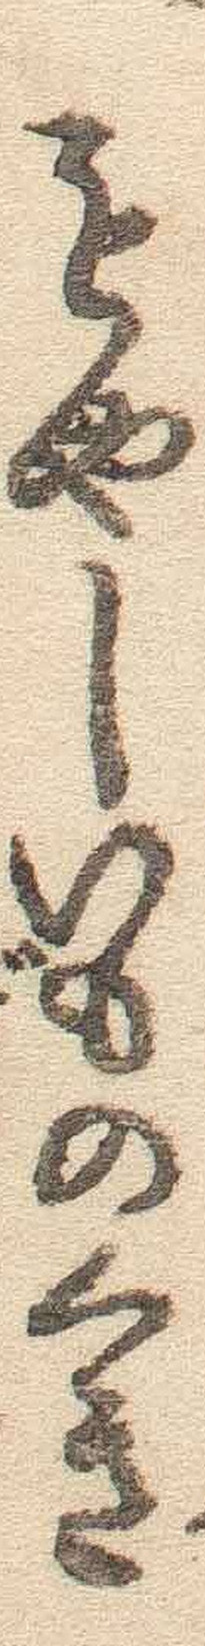もやしいものくき
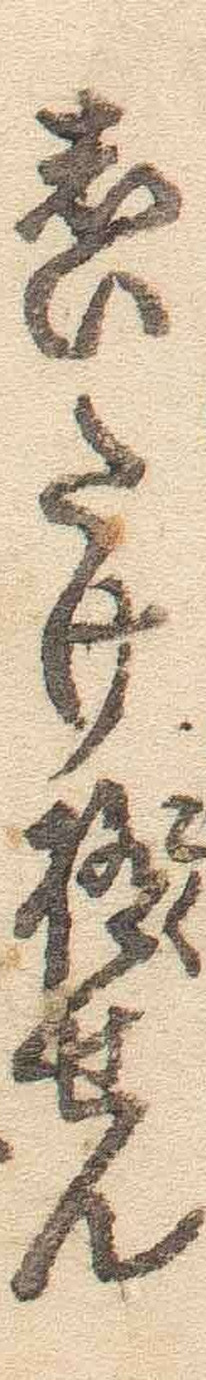しいたけ極せん
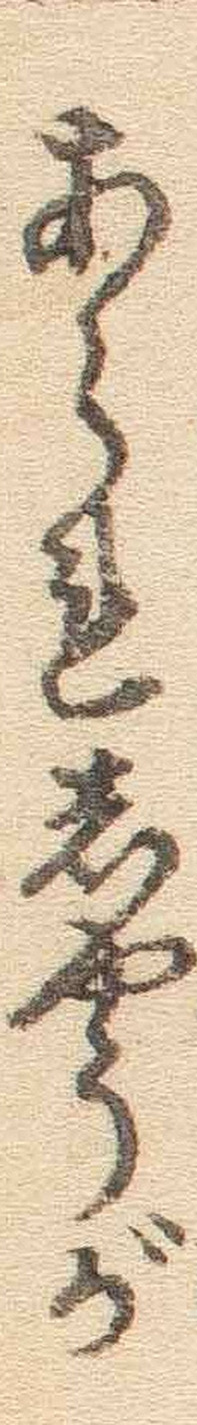あられしやうが
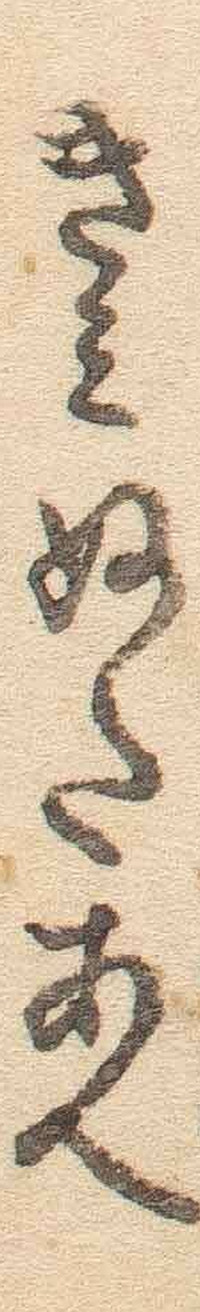きみぬたあへ

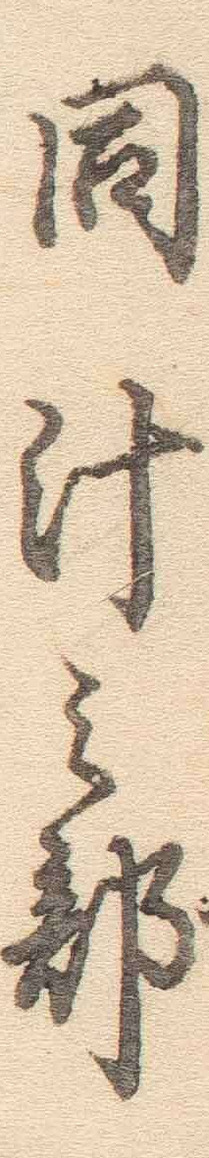同汁之部
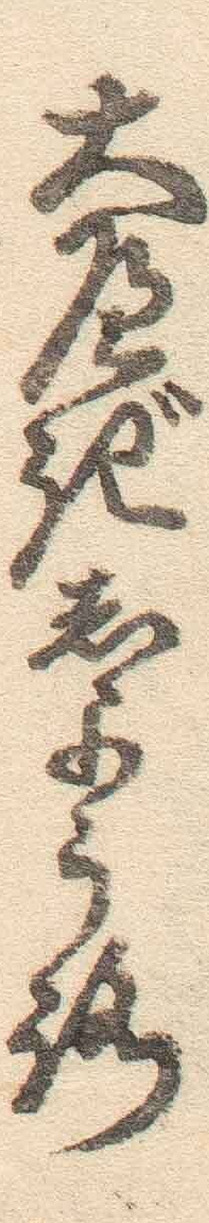大へぎしようろ
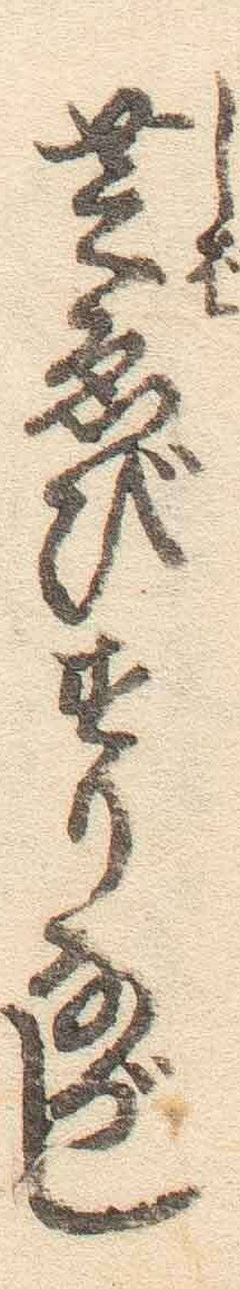芝ゑびすりながし
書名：料理通
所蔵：東京学芸大学附属図書館 国文学研究資料館
